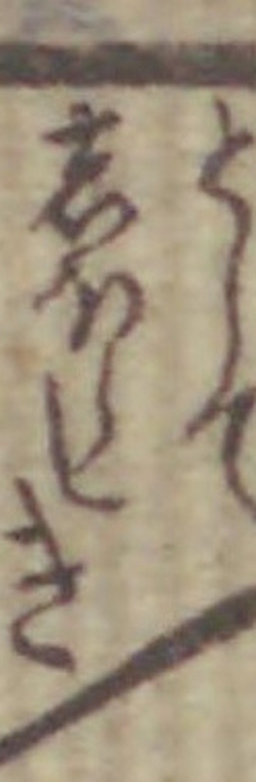しほらしき
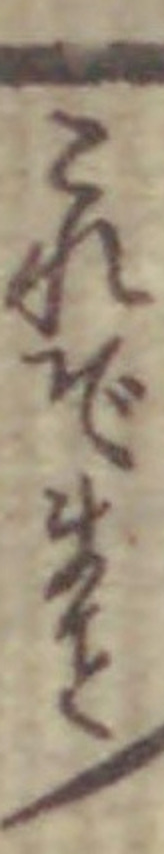これぞまこと
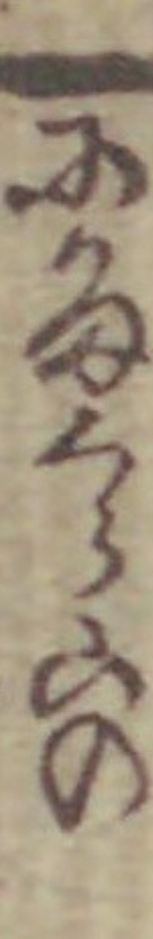にかまくら山の
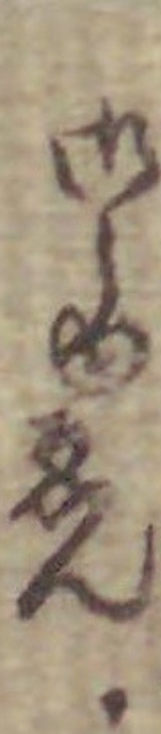御しゆゑん
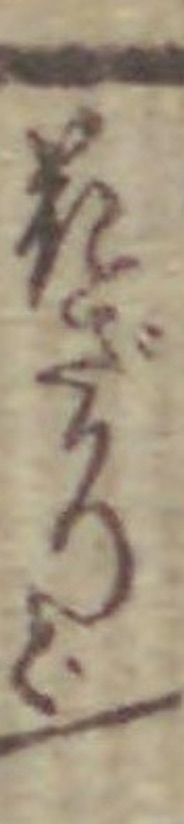花ざかりと
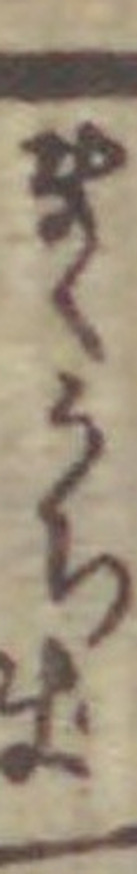まくうちま
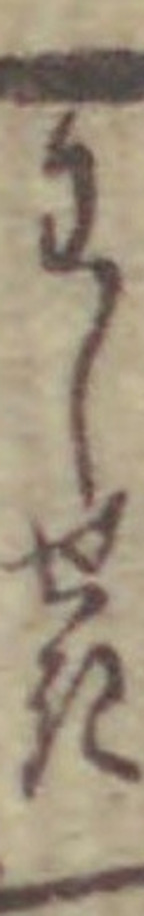わしせき
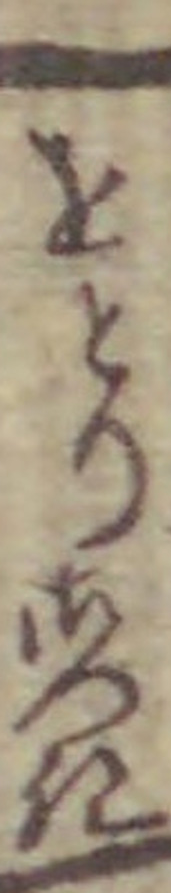をとり御つき
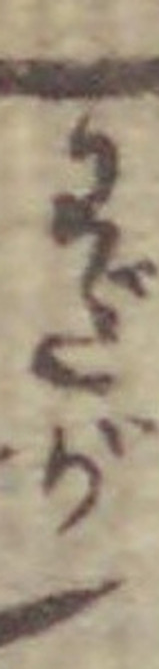わだが
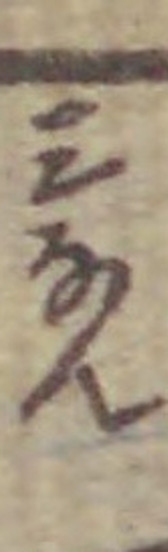三なん
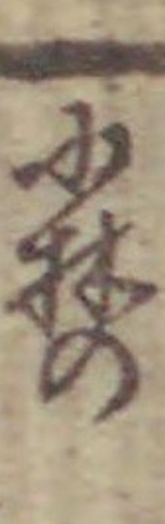小林の
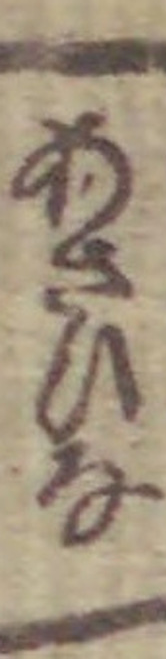あさひな

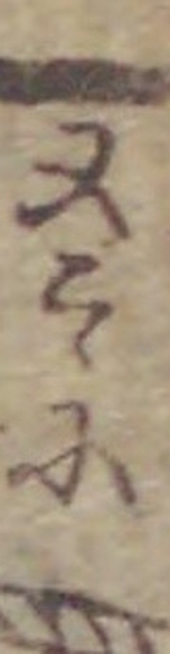又こゝに
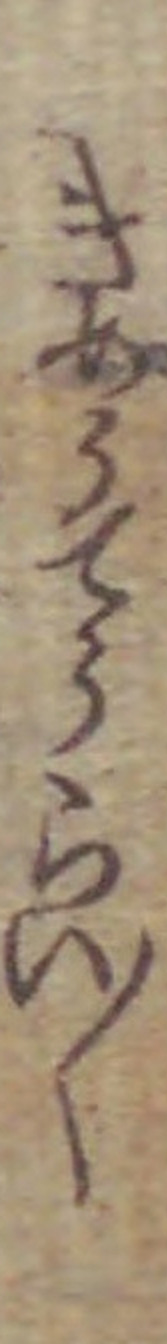きめうてうらい〳〵
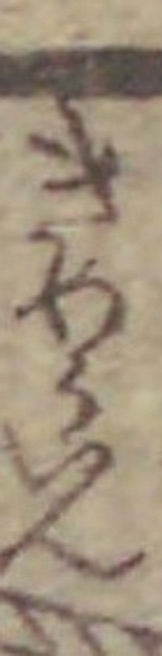きめういん
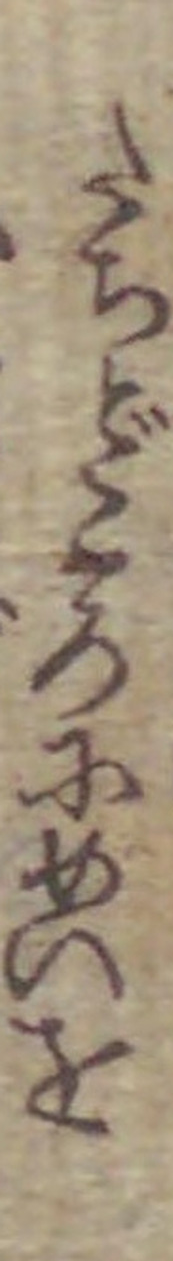たちどころにめいを
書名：鎌倉山紅葉浮名
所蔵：国立国会図書館 National Diet Library, JAPAN
